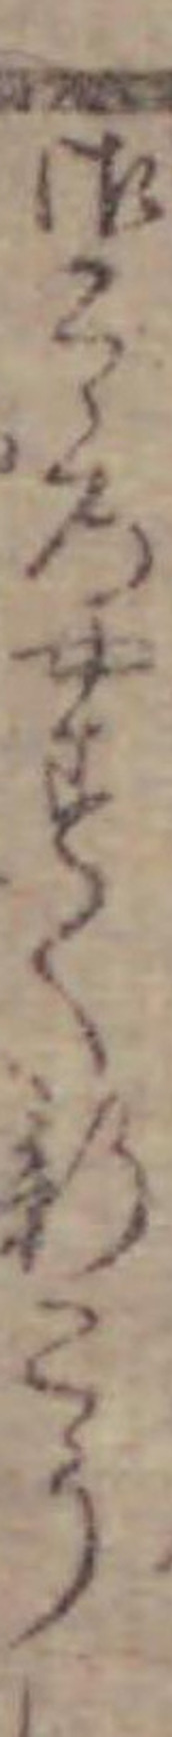御こゝろやすく新こう
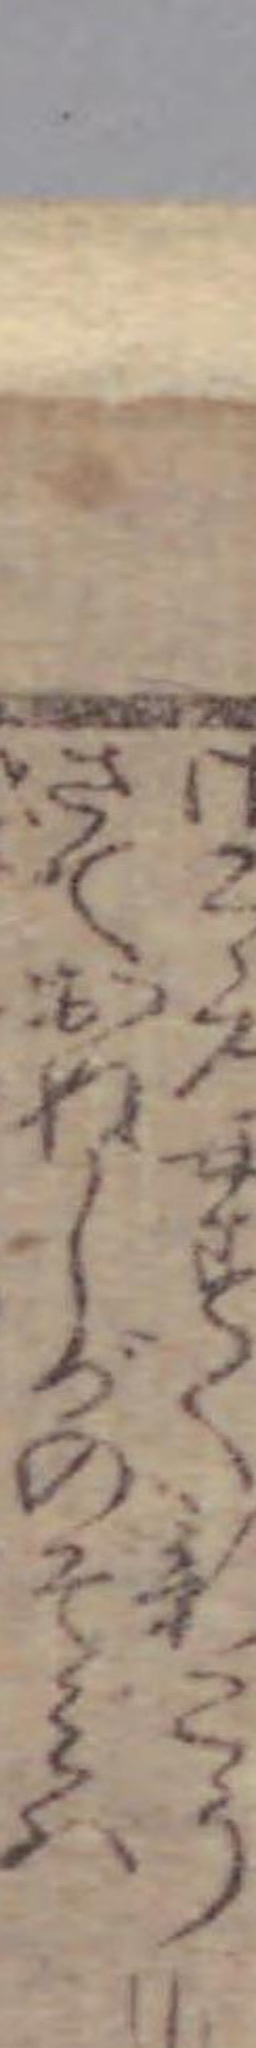さておぬしがのそみは
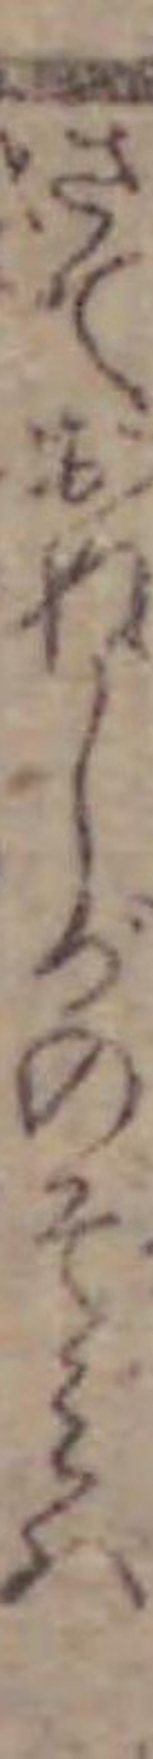さておぬしがのそみは
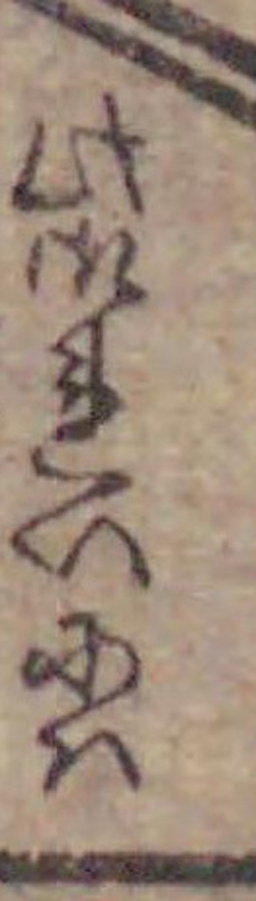此御れいには
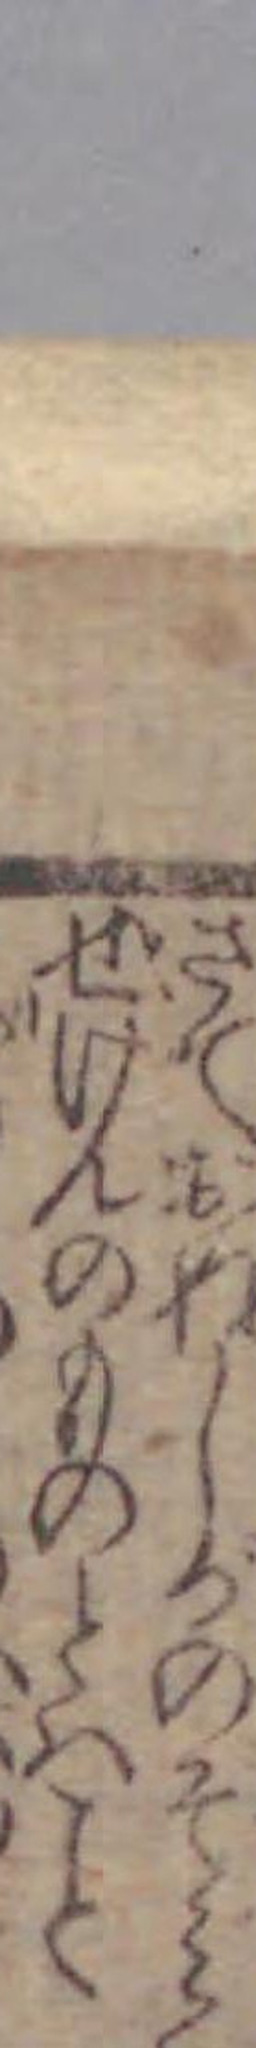せけんのものとはこと
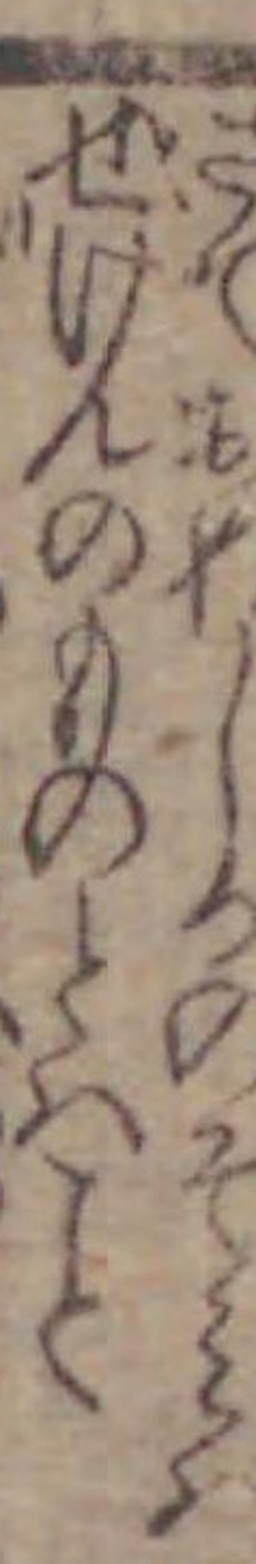せけんのものとはこと
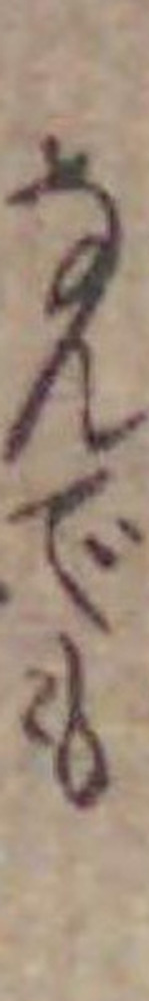なんでも
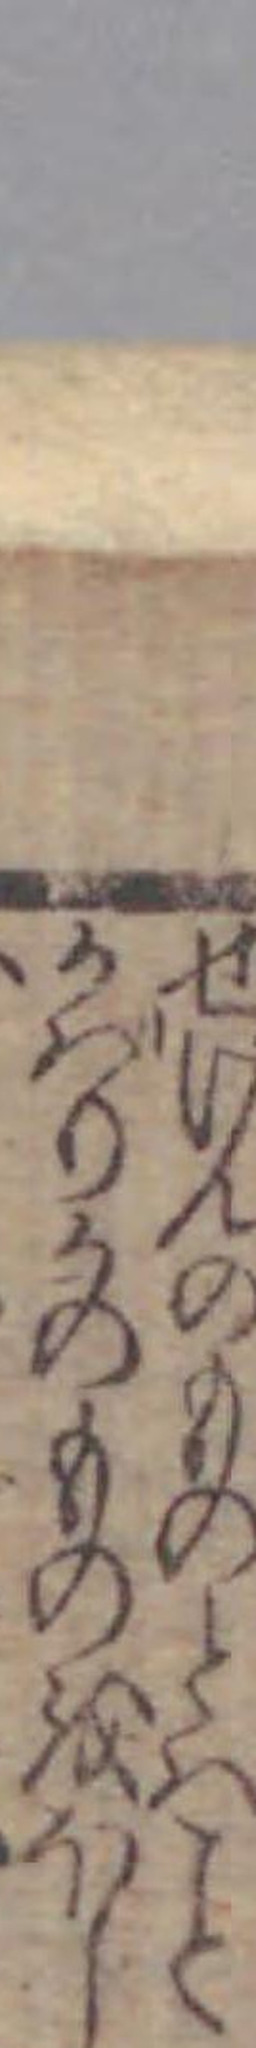がはりかのものをほし
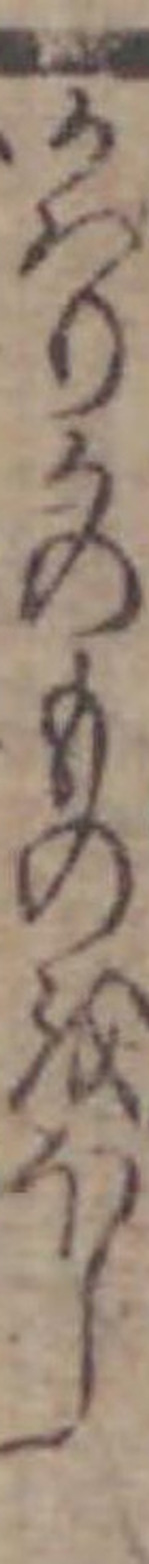がはりかのものをほし
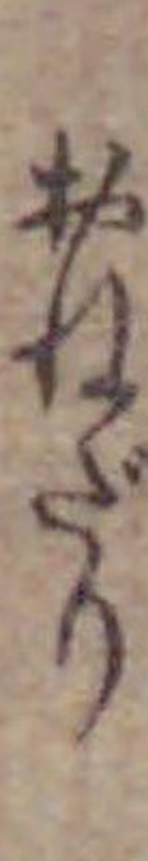おねだり
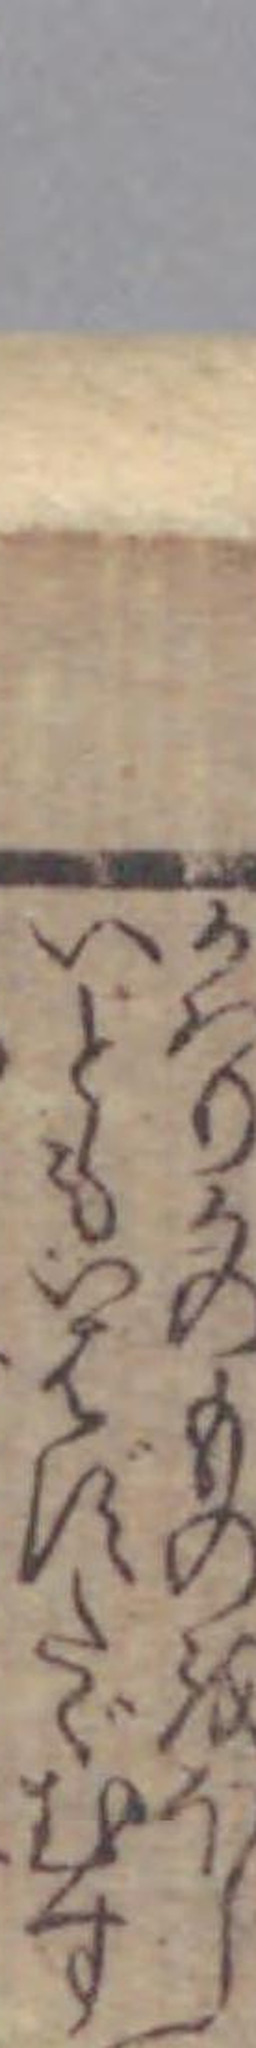いともいはずたゞむす
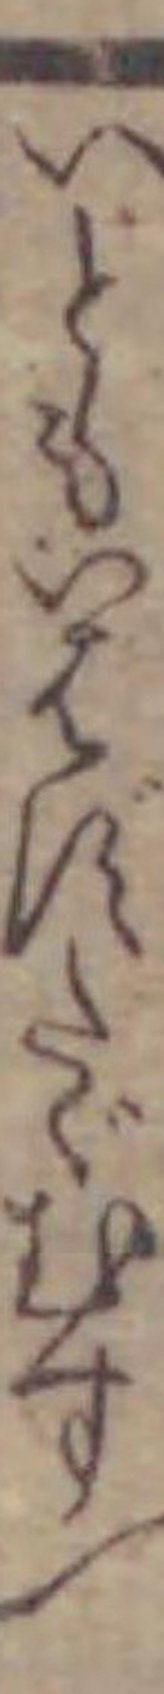いともいはずたゞむす
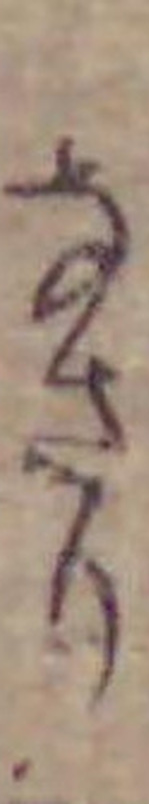なさり
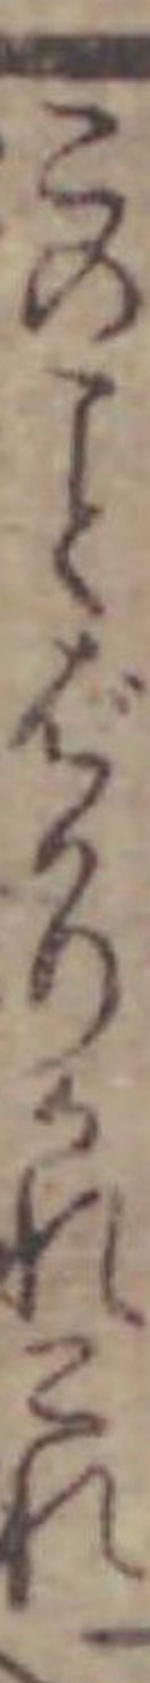このことばかりかれこれ
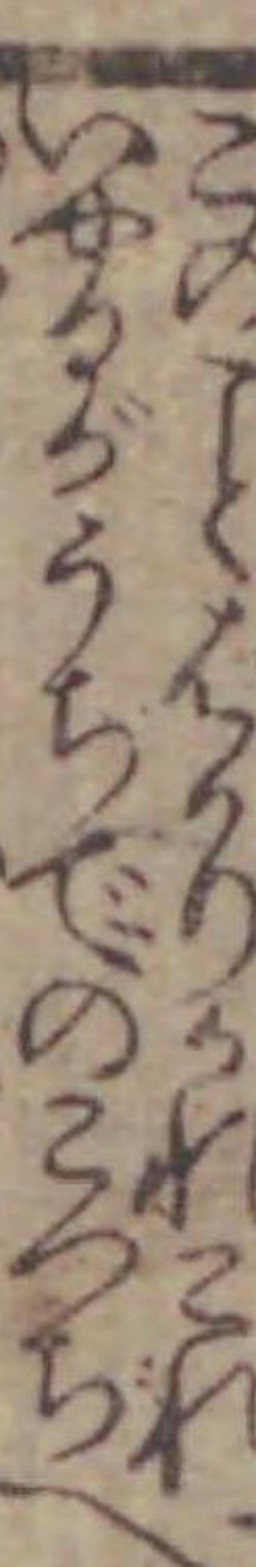いやるがうちでのこつち
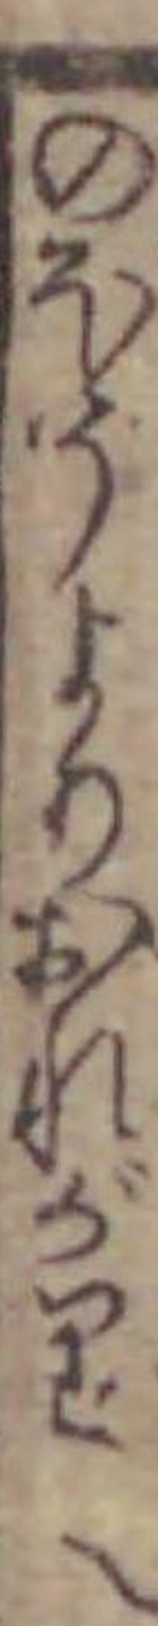のほうよりおれがり
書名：即席耳学問 : 3巻
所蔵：国立国会図書館 National Diet Library, JAPAN
